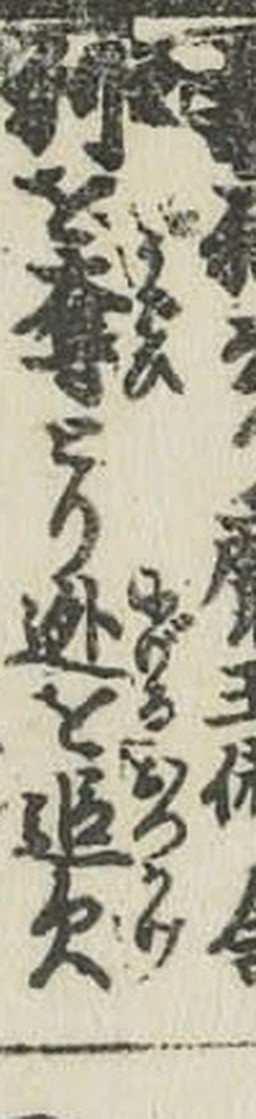利を奪とり逃を追欠
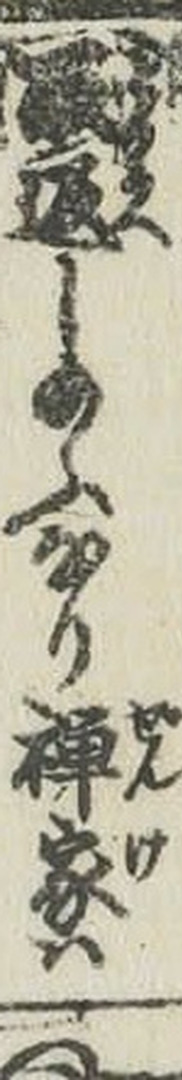取返し給ふなり禅家は
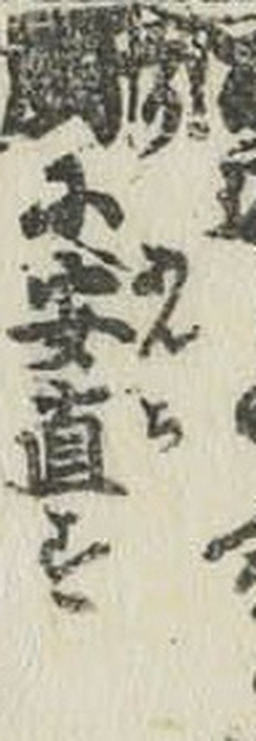厨に安置す
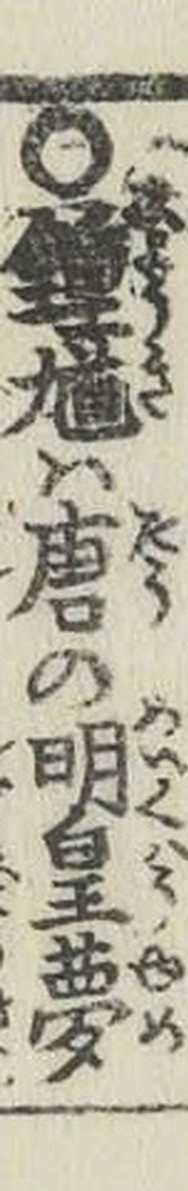○鍾馗は唐の明皇夢
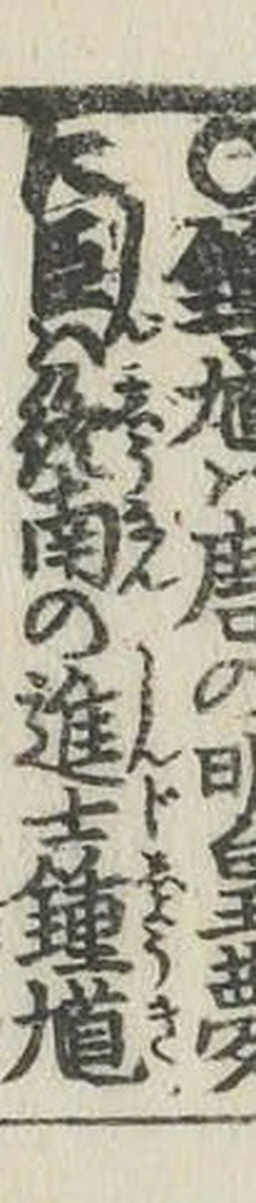に臣は終南の進士鍾馗
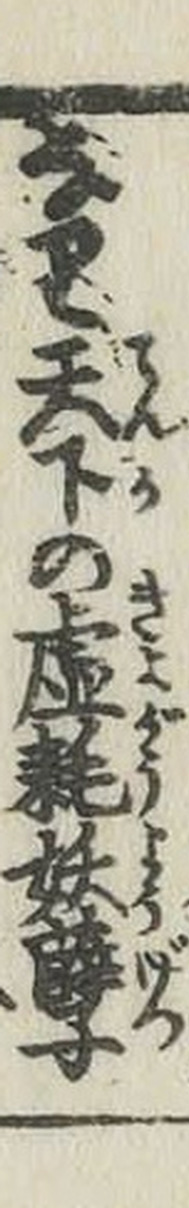なり天下の虚耗妖孽
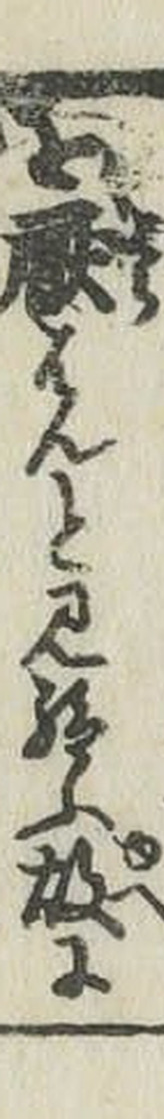を厭はんと見給ふ故に
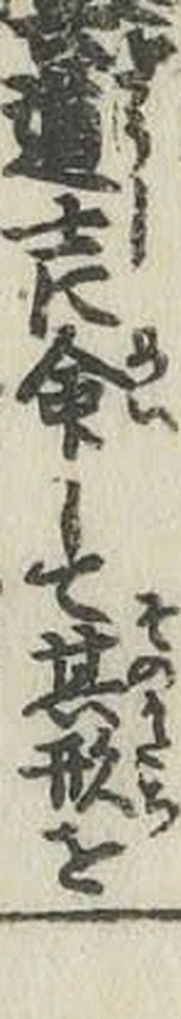道士に命して其形を
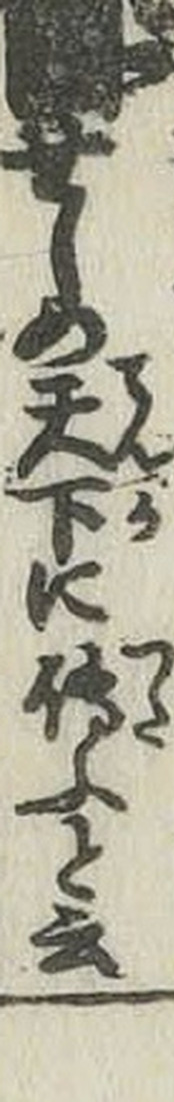せしめ天下に伝ふと云

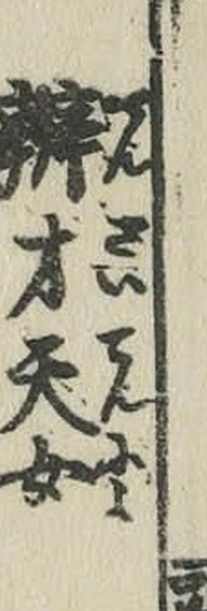弁才天女
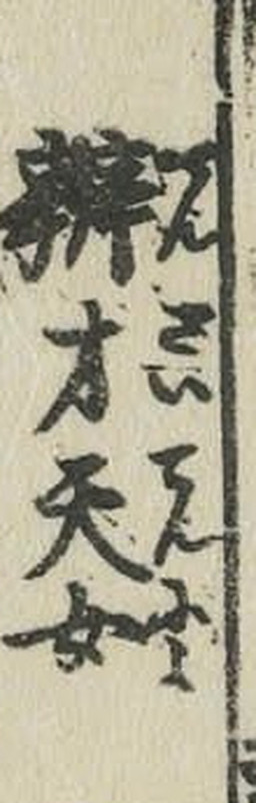弁才天女
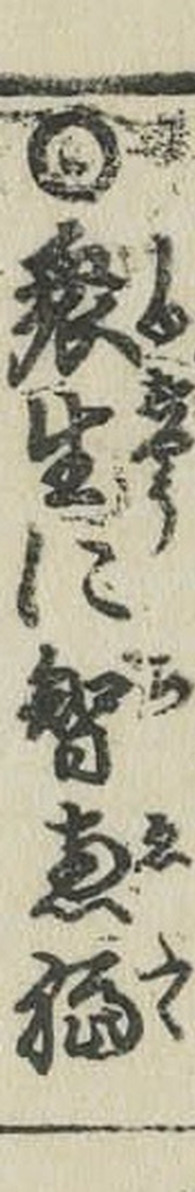○衆生に知恵福
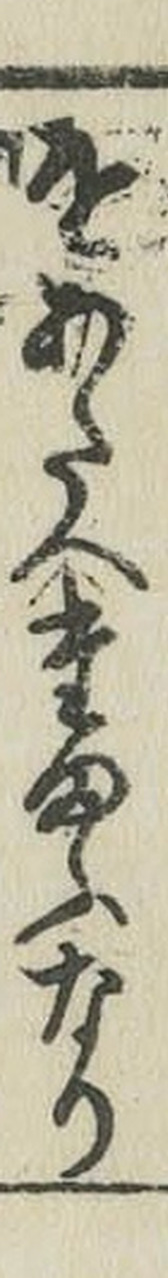をあたへたまふなり
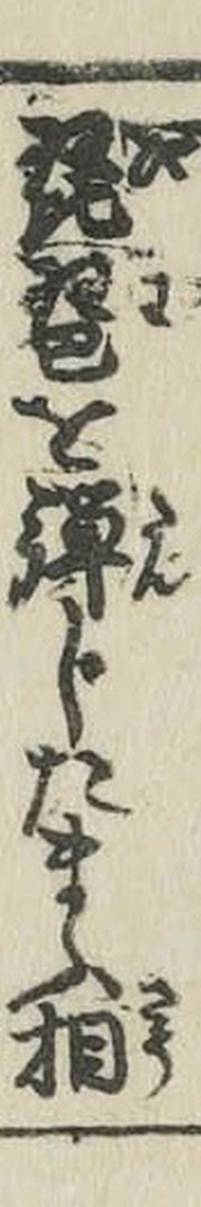琵琶を弾じたまふ相
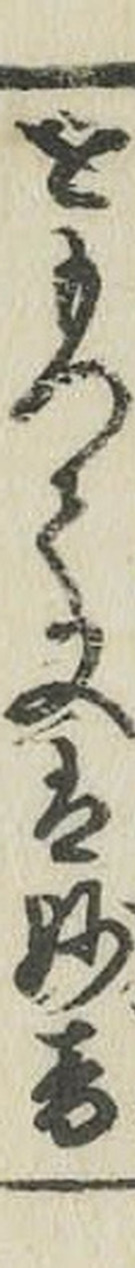をもつて又は妙音
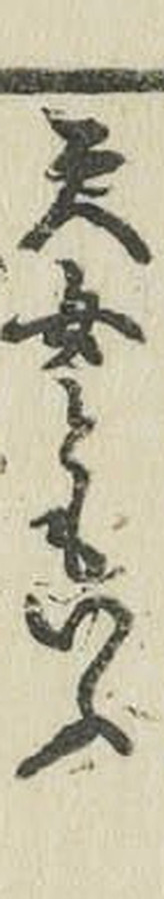天女ともいふ
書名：増補頭書訓蒙図彙大成 10巻 10:巻之21
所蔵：東京学芸大学教育コンテンツアーカイブ
